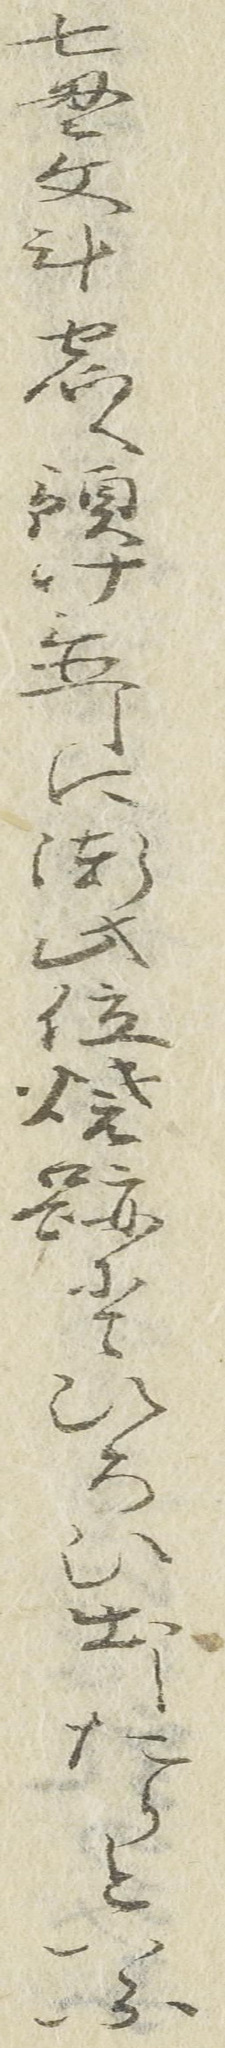七貫文斗宿へ預け置きしに漸此位焼跡にてひろひ出したりといふ
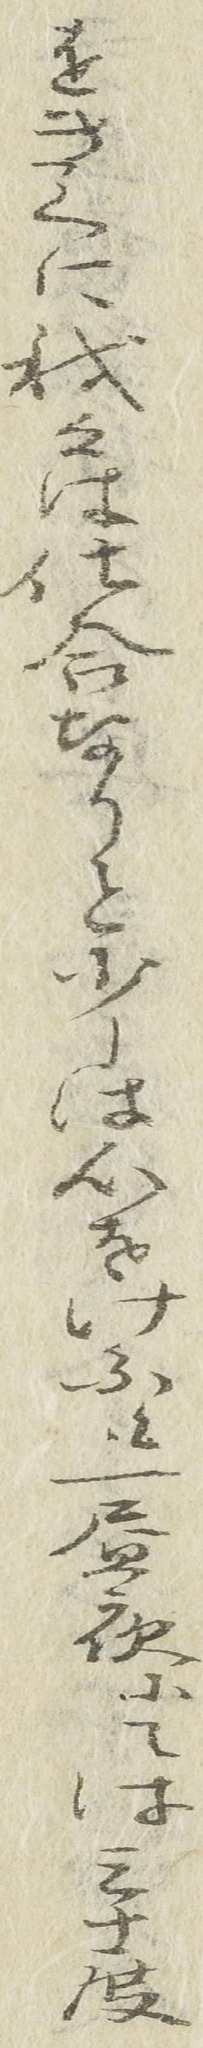をきくに我々は仕合なりと少しは心をけふも一昼夜にては三十度
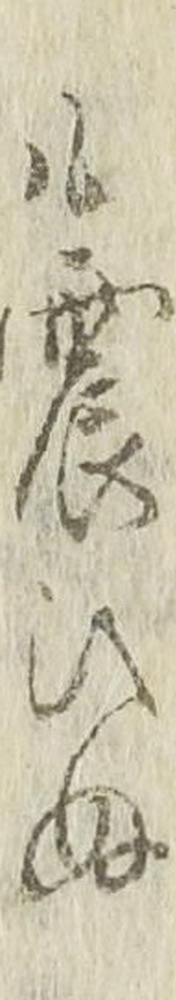も震ひぬ
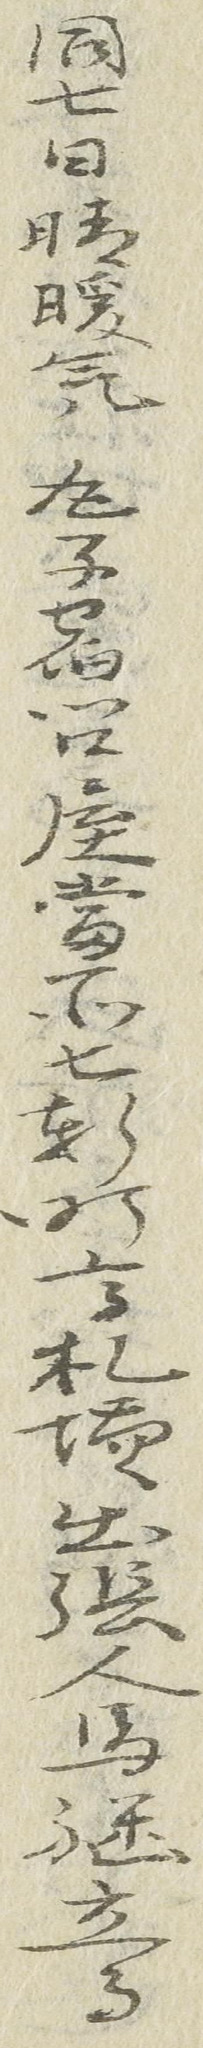同七日晴暖気丸子宿問屋当所七軒町高札場へ出張人馬継立る
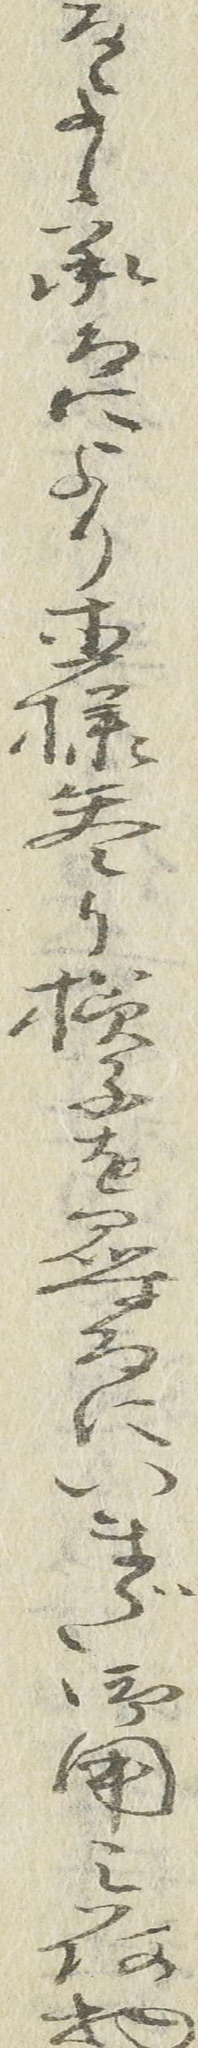るよし承るにより直様参り様子を尋るにいまだ御用之荷物
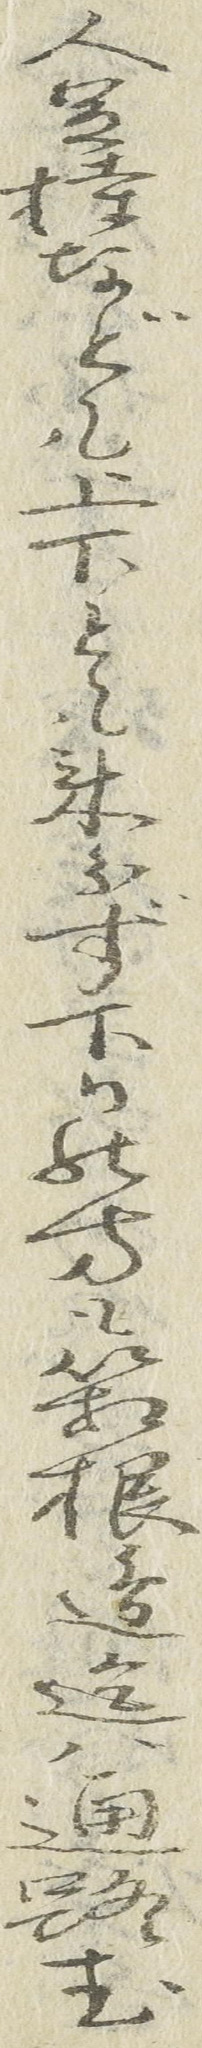人足持なども上下とも来らず下りの方も箱根辺迄は通路む
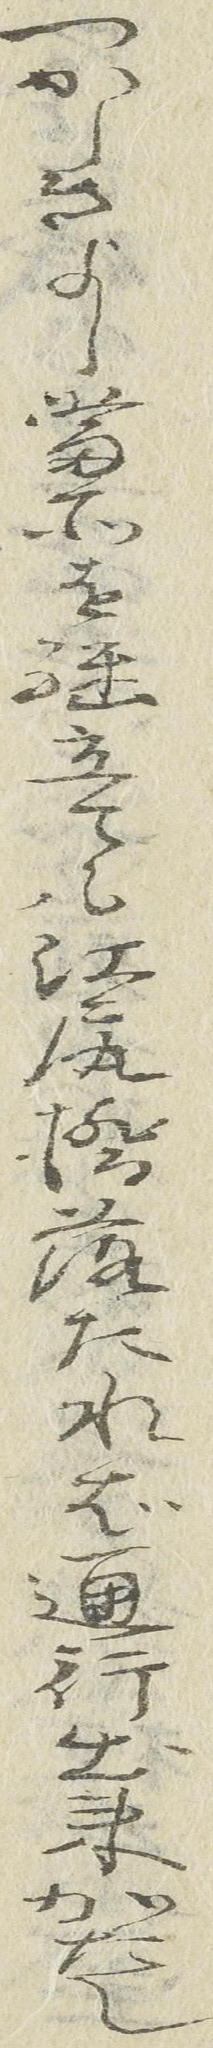つかしきよし当所を継立ても江尻橋落たれば通行出来がたし
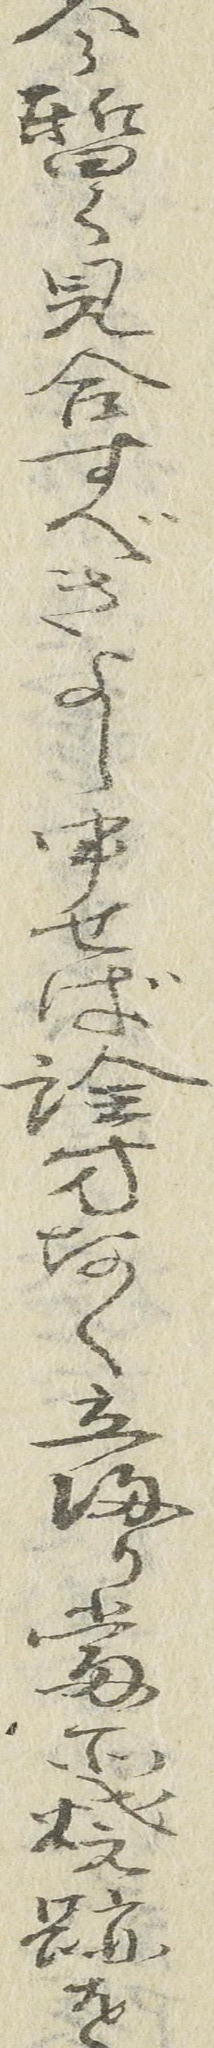今暫く見合すべきよし申せば詮方なく立帰り当所焼跡を
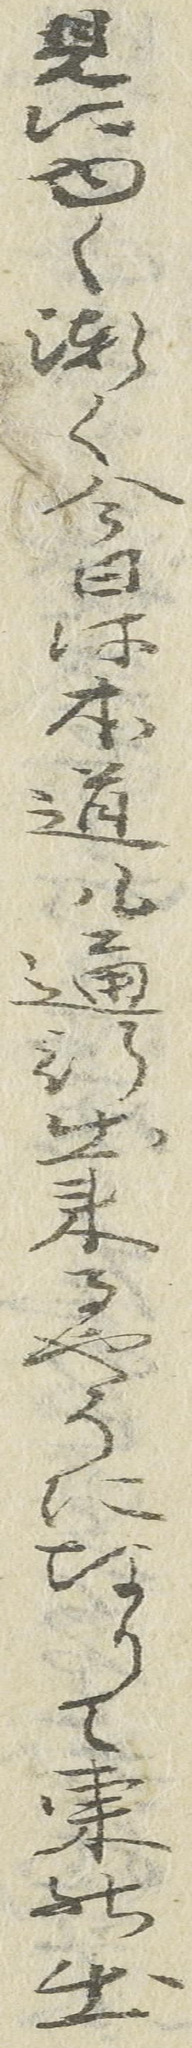見にゆく漸く今日は本道も通行出来るやうになりて東の出

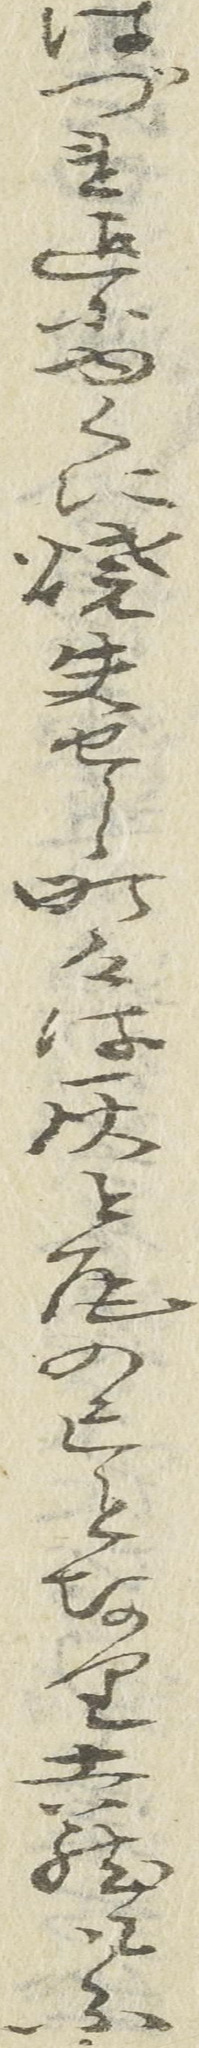はづれ迄にゆくに焼失せし町々は灰と瓦のみとなり土蔵もふ
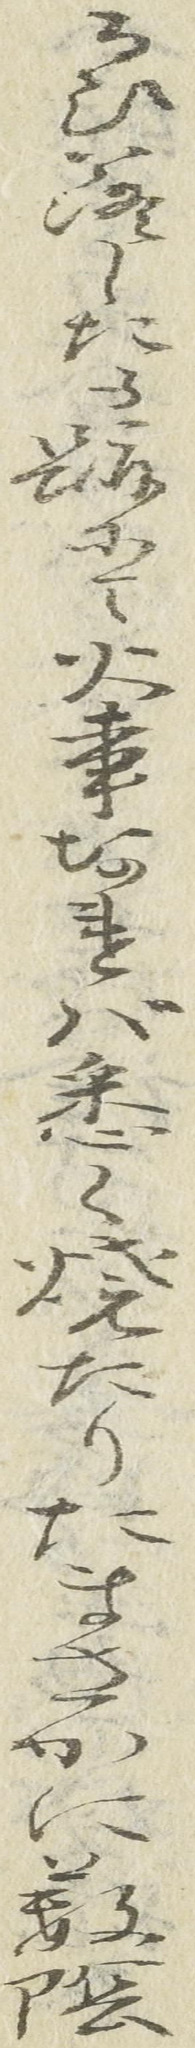るひ落したる跡にて火事なれば悉く焼たりたまさかに藪陰
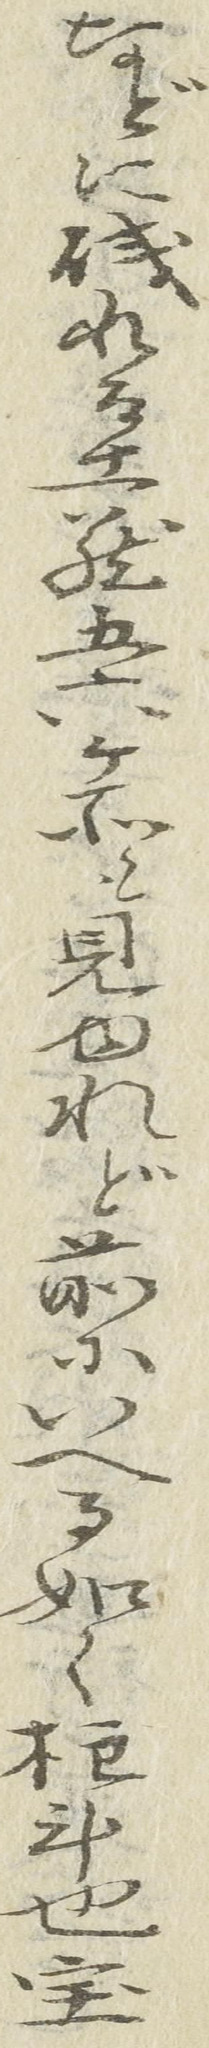などに残れる土蔵五六ヶ所も見ゆれど前にいへる如く柱斗也宝
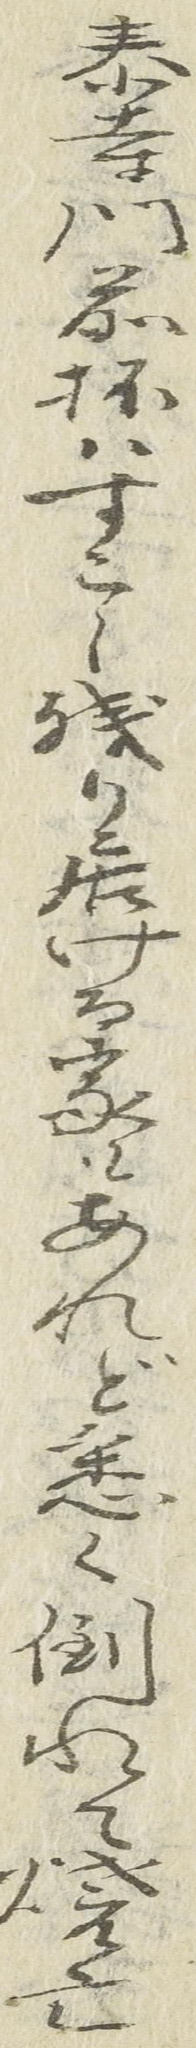泰寺門前抔はすこし残り居ける家もあれど悉く倒れて焼亡
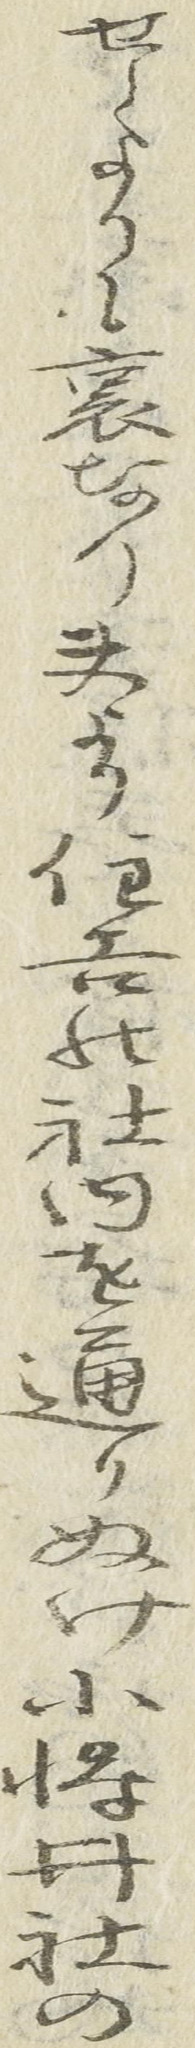せしよりし哀なり夫より住吉の社内を通りぬけ小将井社の
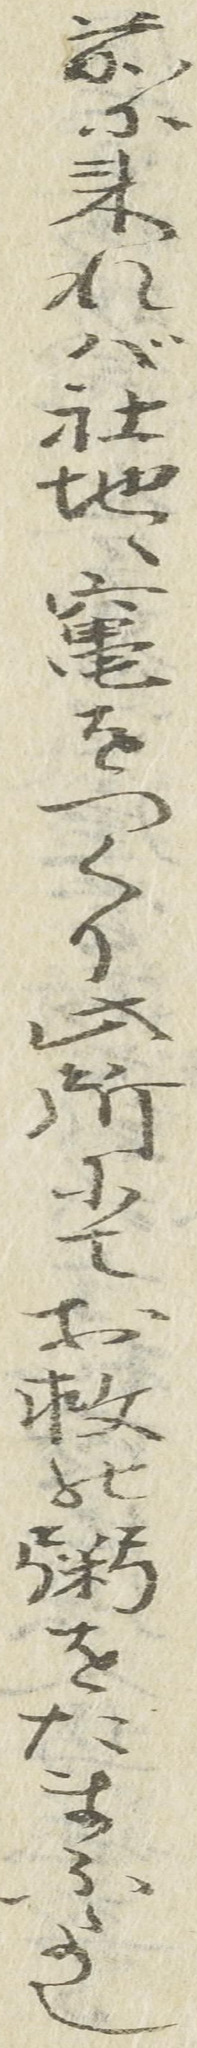前に来れば社地へ竈をつくり此所にてお救の粥をたまふよし
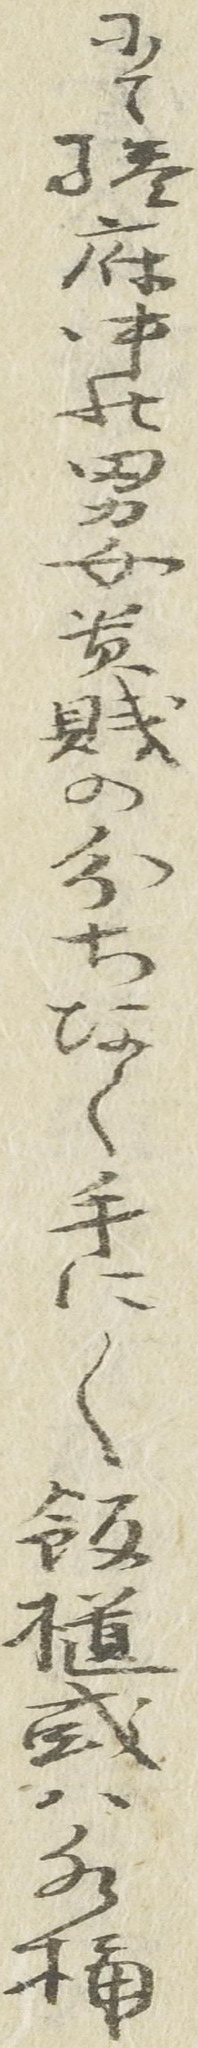にて駿府中の男女貴賤の分ちなく手に〳〵飯櫃或は水桶
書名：地震前兆集　全
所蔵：東京大学地震研究所図書室 Earthquake Research Institute Library, The University of Tokyo, JAPAN
